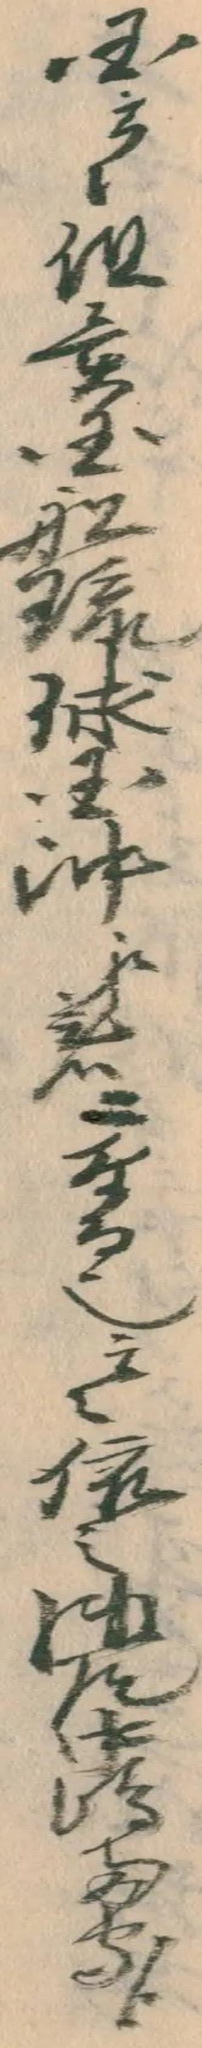国云〻但異国舩琉球国沖え着ニ付而也云々依之瀬尾中嶋両家ゟ
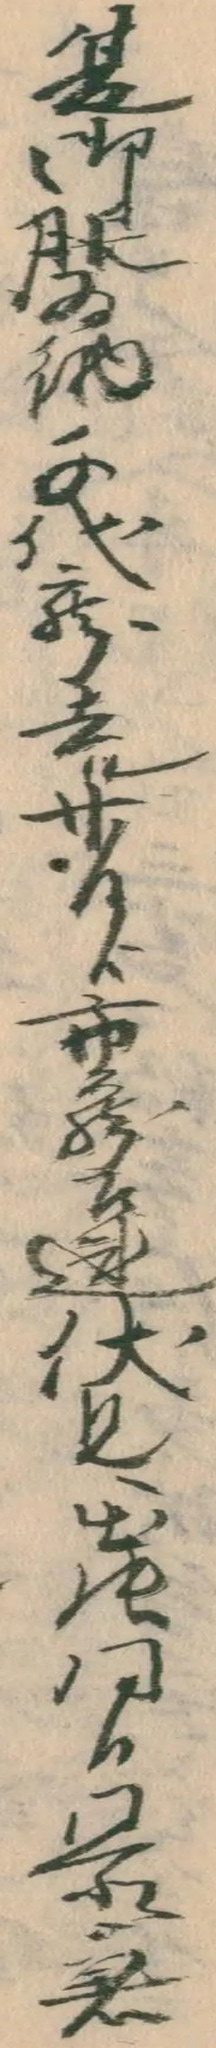夏御服為納千代蔵去ル廿日ゟ市蔵召連伏見へ出張同日同所御着
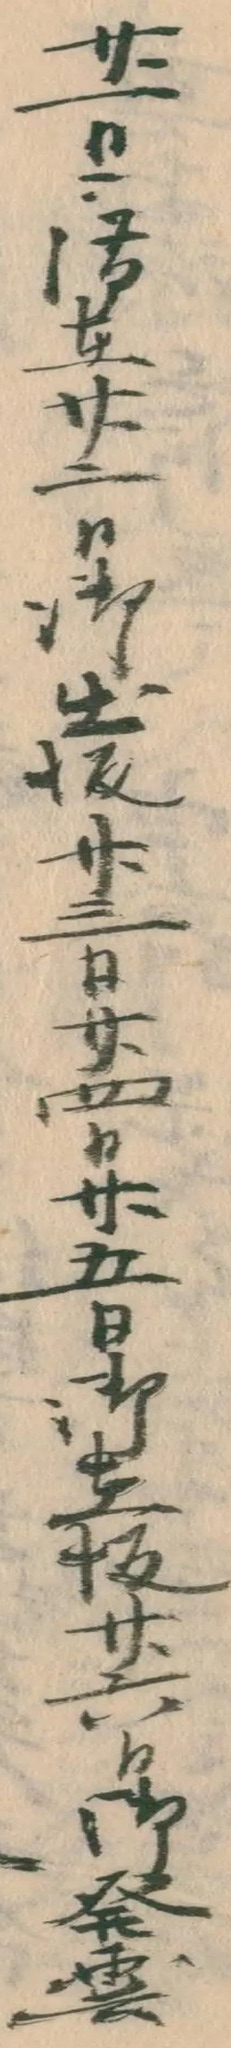廿一日御滞在廿二日御出坂廿三日廿四日廿五日御在坂廿六日御発輿
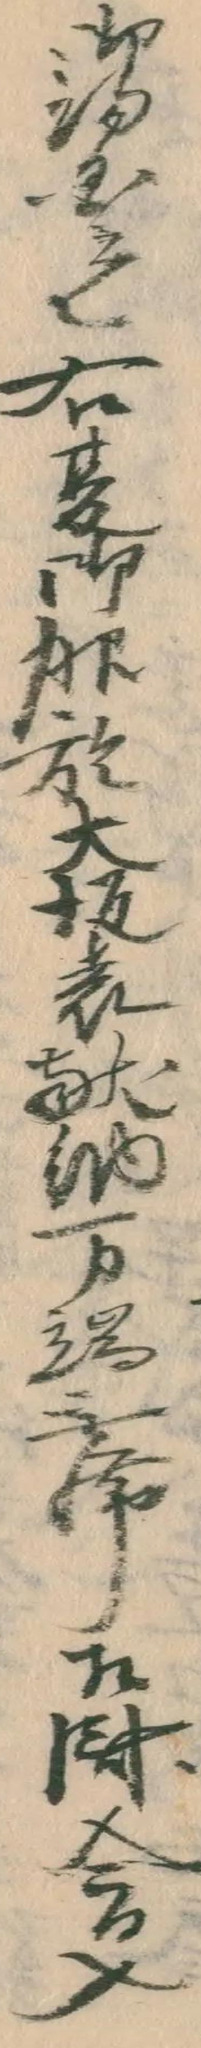御帰国云々右夏御服於大坂表献納万端無滞相済今日入
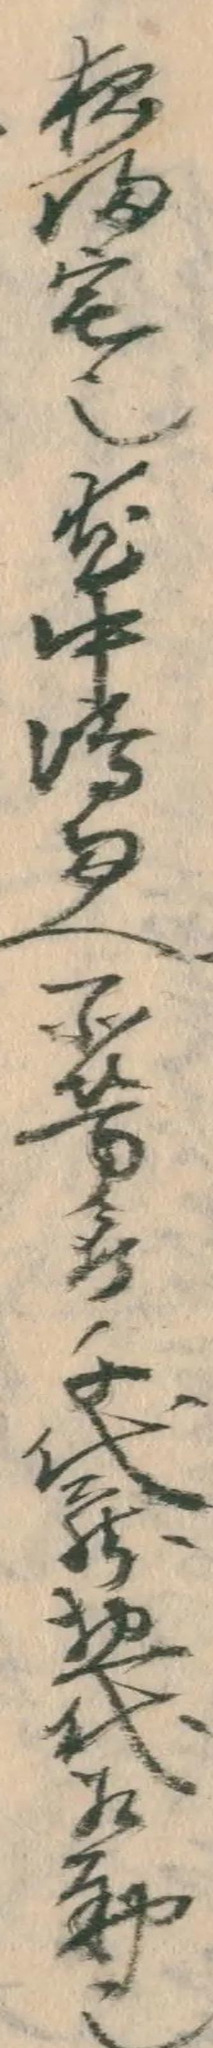夜帰宅也尤中嶋両人所労ニ付千代蔵惣代相勤也
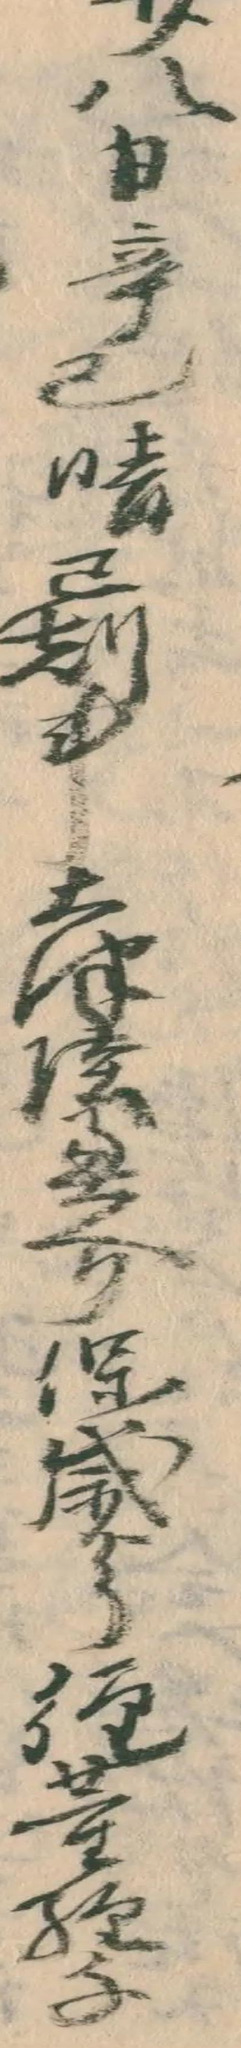廿八日辛巳晴巳刻斗大津陸奥介保歳より経董経千
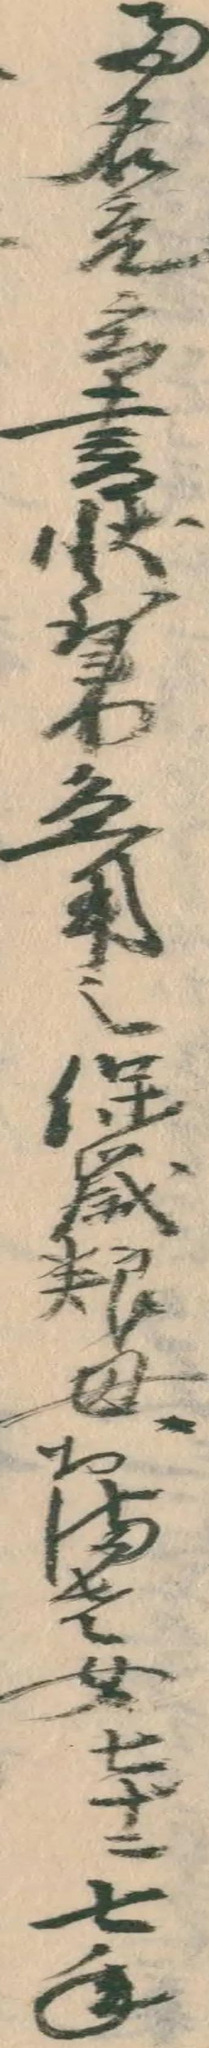両名充ニ而二書状到来急用也保歳養母お満老女七十二七年
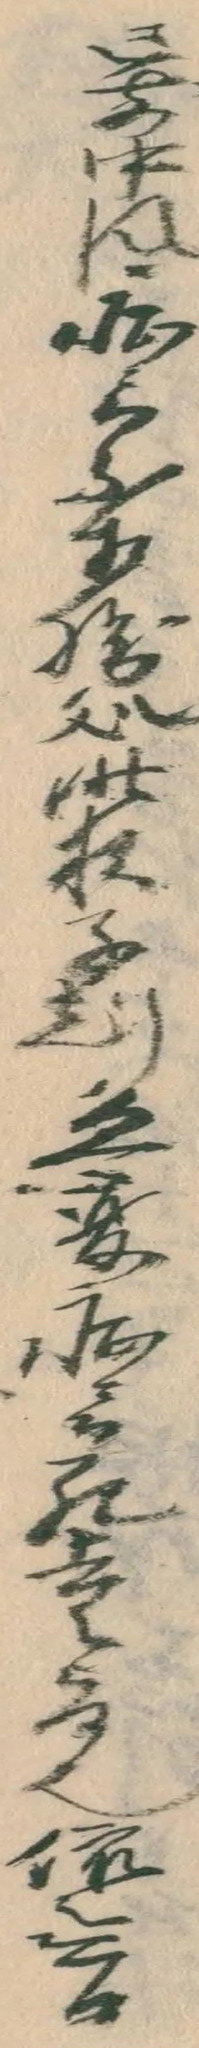已前中風症ニ而不相勝処昨夜子刻変病ニ而死去之旨也依之今日
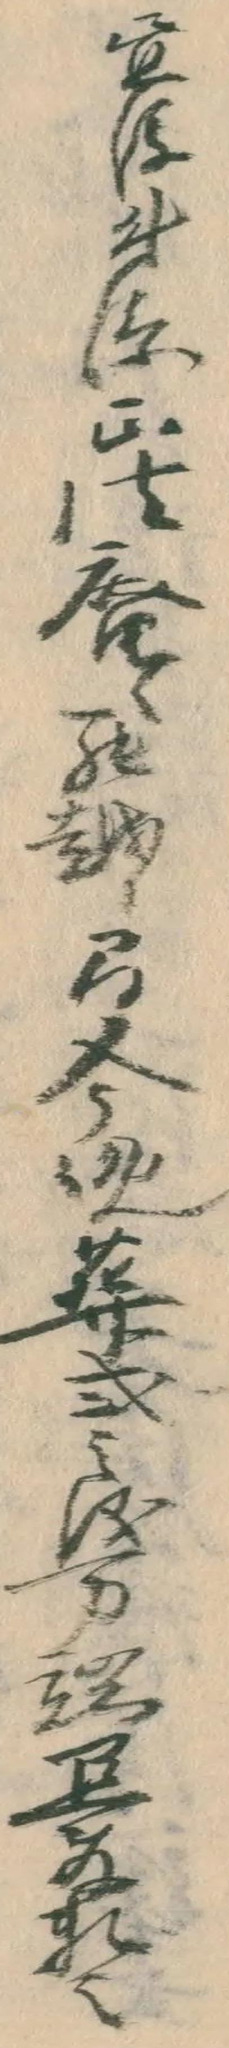昼後付添正法庵へ罷越候間今晩葬式之儀万端宜敷頼之
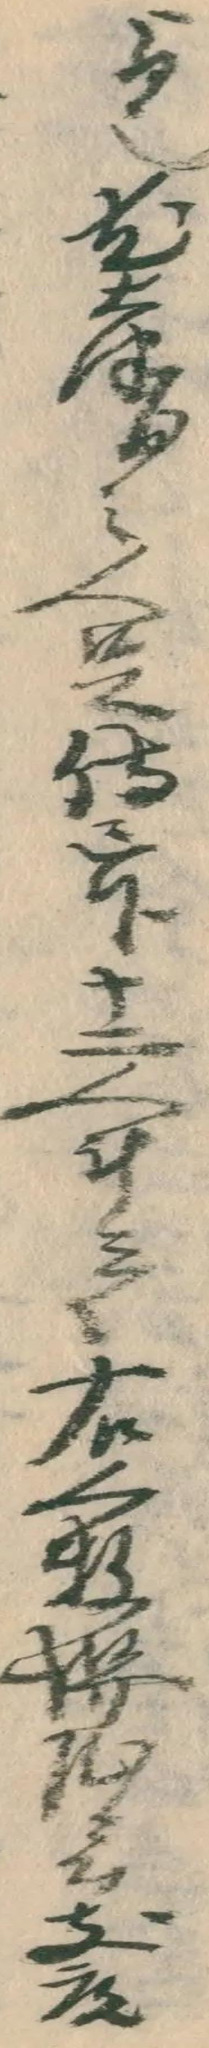旨也尤大津ゟ之人足侍已下十二人斗云々右人数堺屋ニ而支度
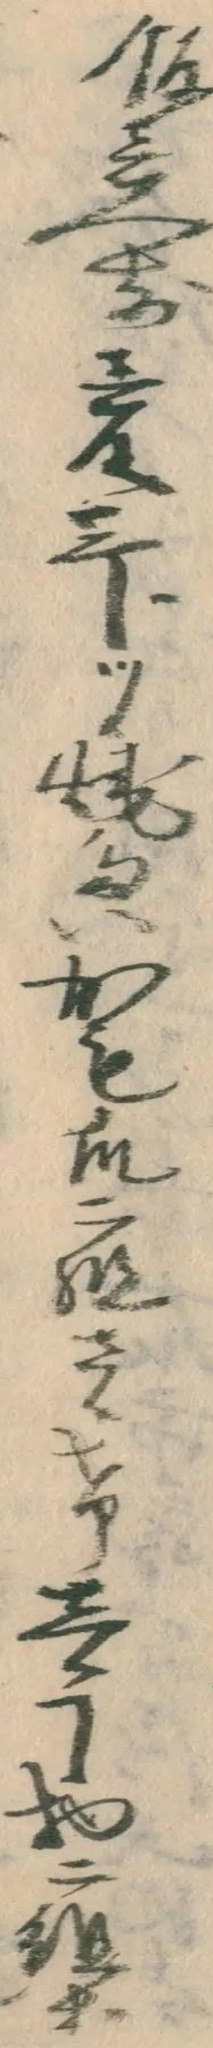飯壱人前壱反三分ツ焼たいかも凡二組さゝけしたし物二組等
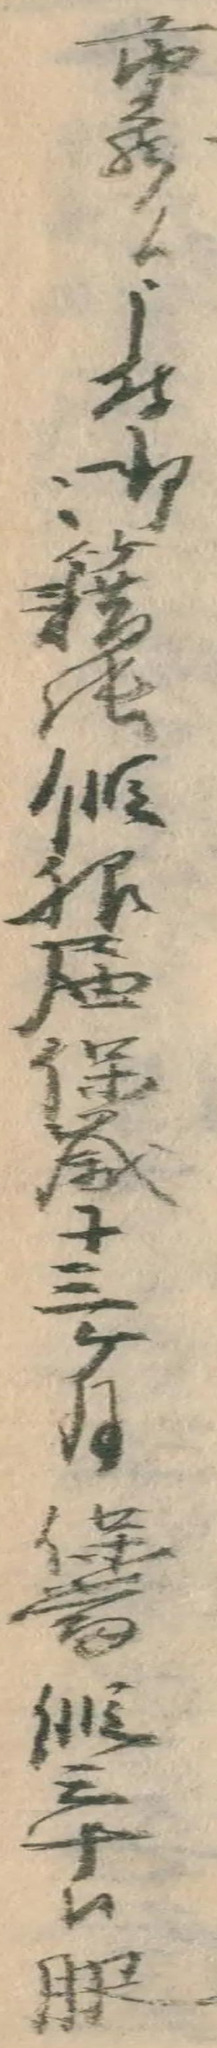市蔵ゟ申付御籍張仮服届保歳十三ケ月保當仮三十日服

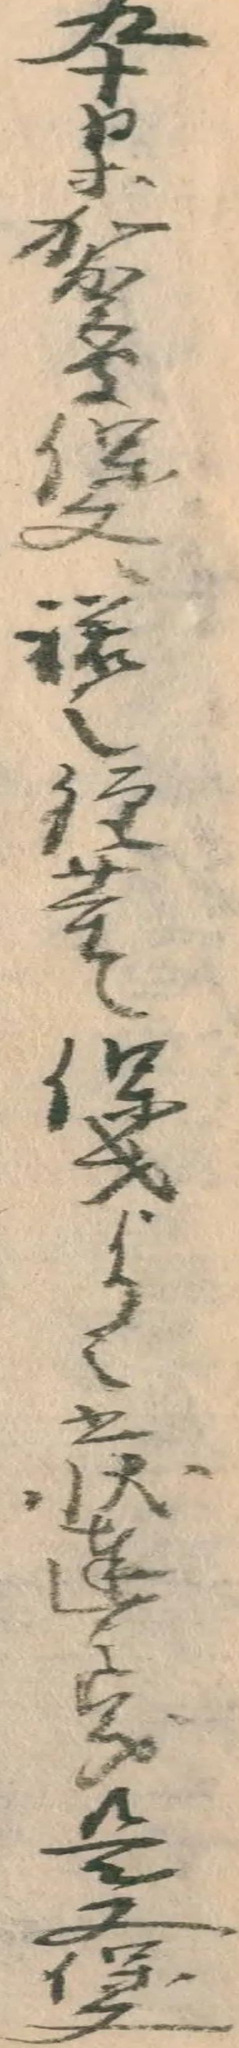九十日等加賀守保文ヘに諾也経董ヘ保才より之書状達之義是又保文
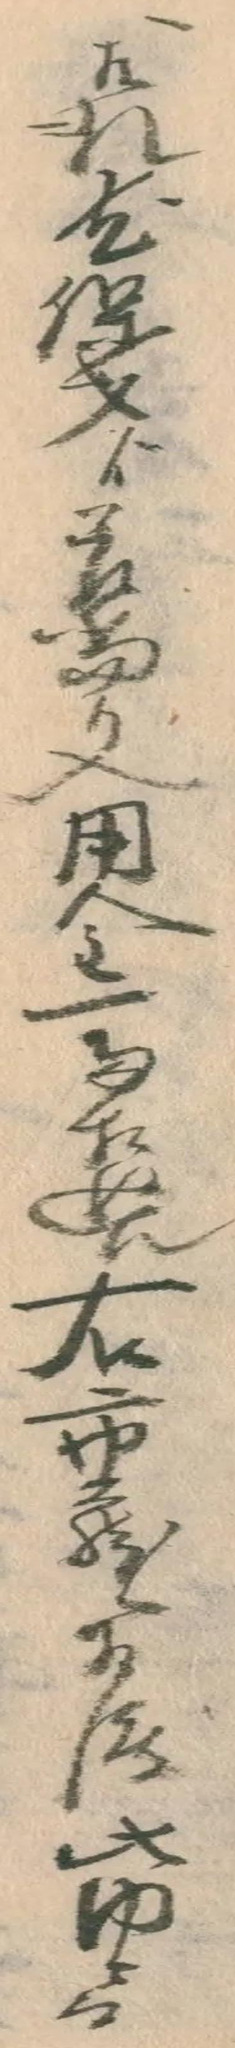へ相得尤保才ゟ差當り入用金一両相廻ル右市蔵へ相渡此内ニ而
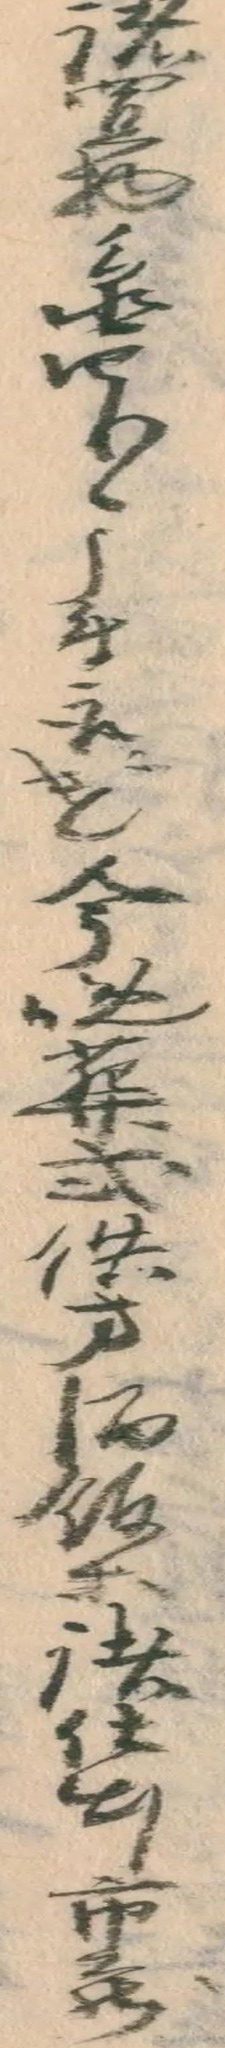諸買物亀四郎へ申付取ニ遣今晩葬式供方酒飯等諸仕出し市蔵
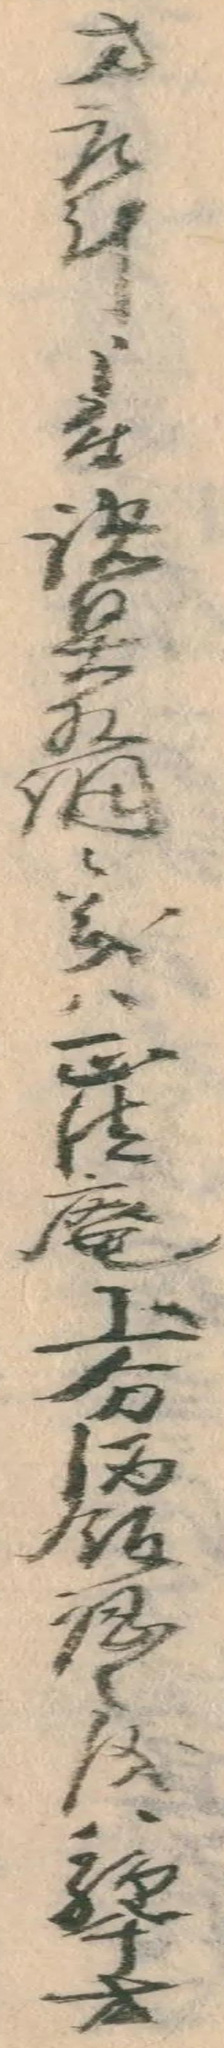方取斗申付諸具相調候義ハ正徳庵上分酒飯認之儀ハ経千方
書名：賀茂社記録. 第70冊
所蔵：国立国会図書館 National Diet Library, JAPAN
